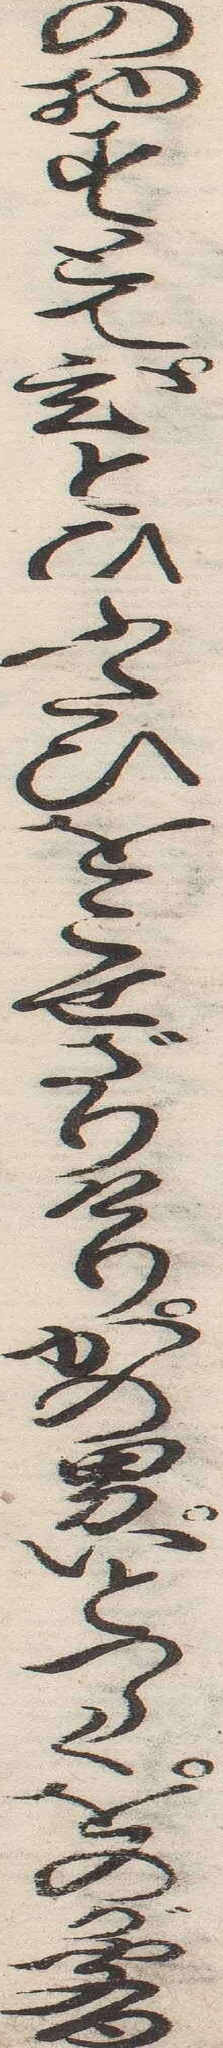の物すとて。ひとひふたひをこせざりけり。かの男。いとつらく。をのが聞ゆ
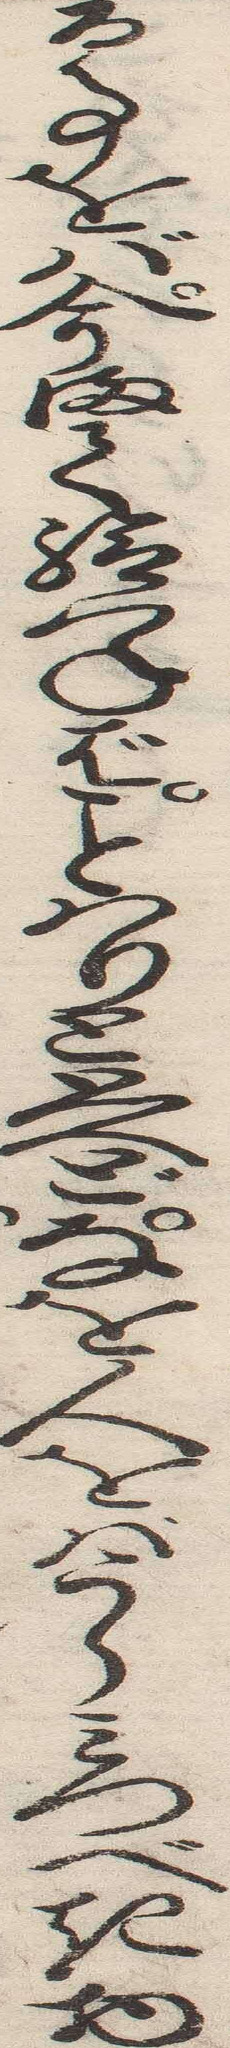る事をば。今まて給はねば。ことはりと思へど。なを人をはうらみつべき物
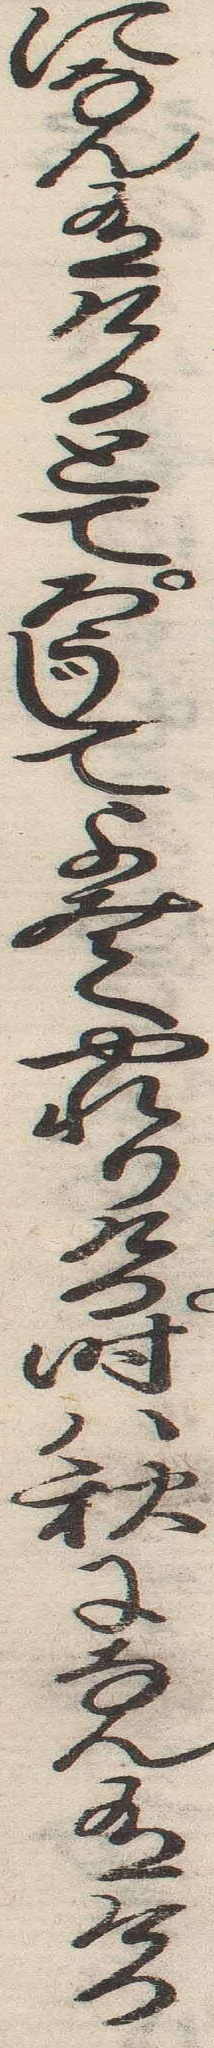になん有けるとて。ろうじてよみてやれりける。時は秋になん有ける

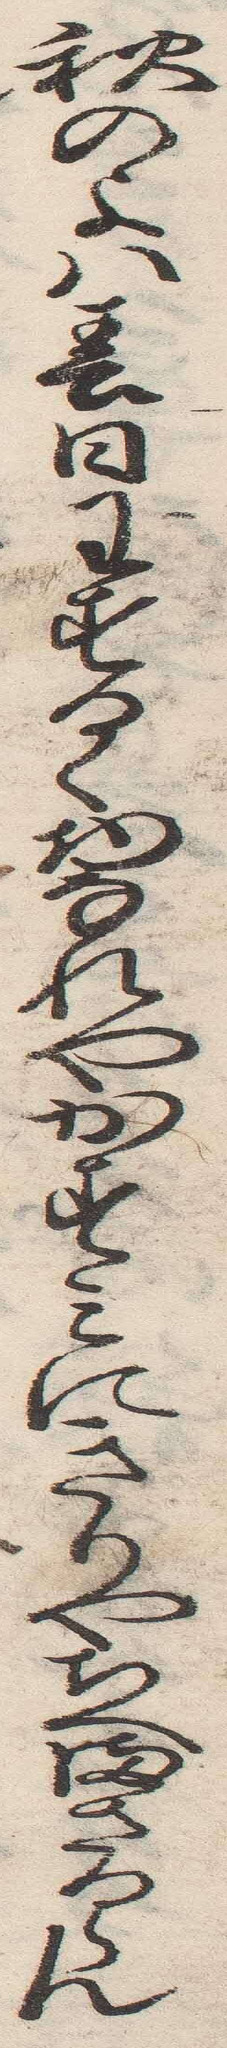秋のよは春日わするゝ物なれやかすみにきりやちへまさるらん
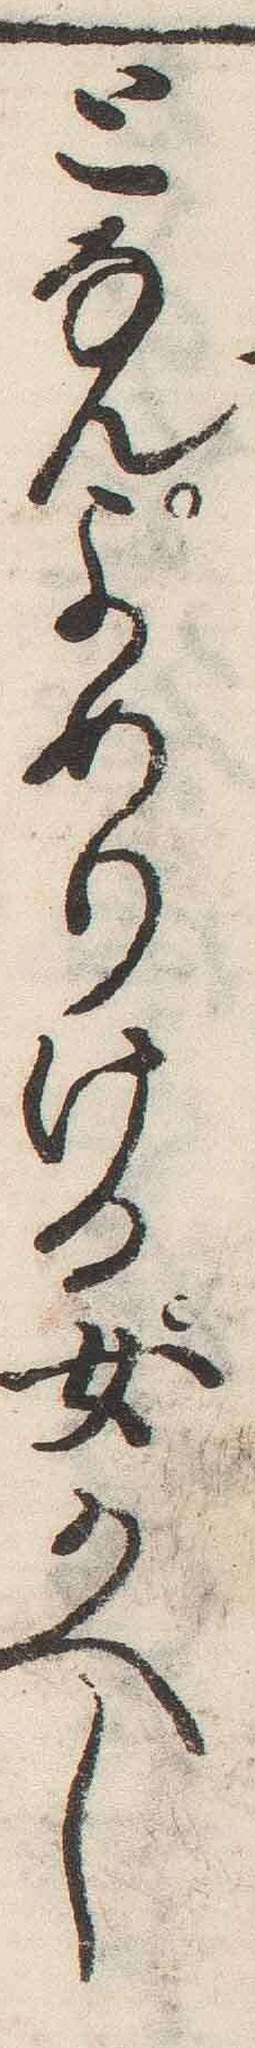となん。よめりける。女かへし
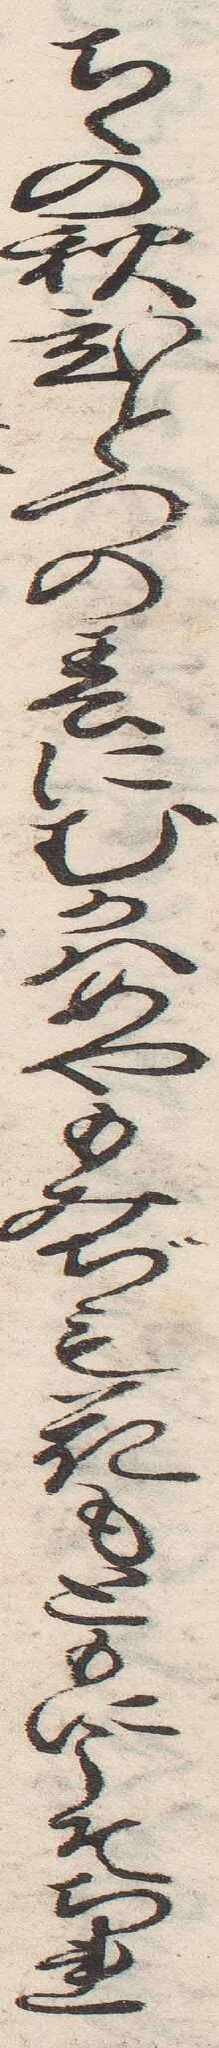ちゝの秋ひとつのはる春にむかはめやもみぢも花もともにこそちれ
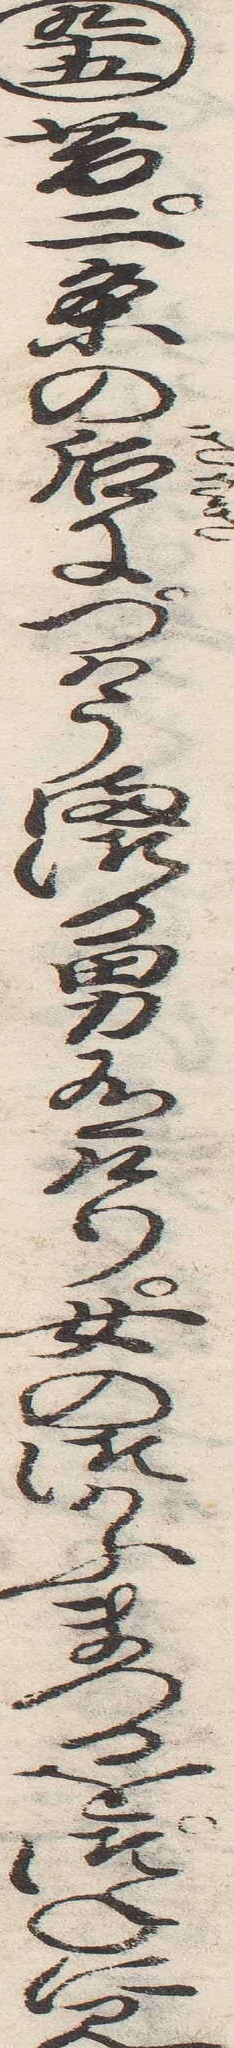九十五昔。二条の后に。つかうまつる男有けり。女のつかうまつるを。つねに見
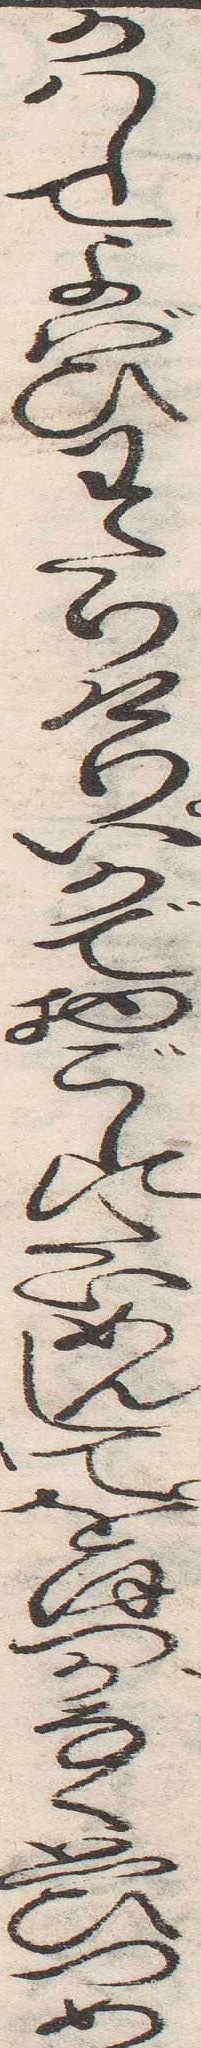かはしてよばひわたりけり。いかで物ごしにたいめんして。おほつかなく思ひつめ
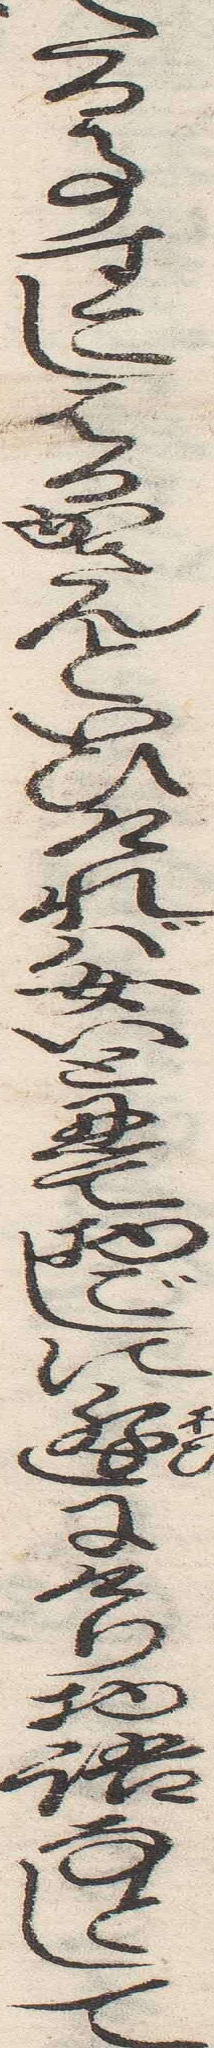たる事すこしはるかさんといひければ女いと忍て物ごしに逢にけり物語なとして
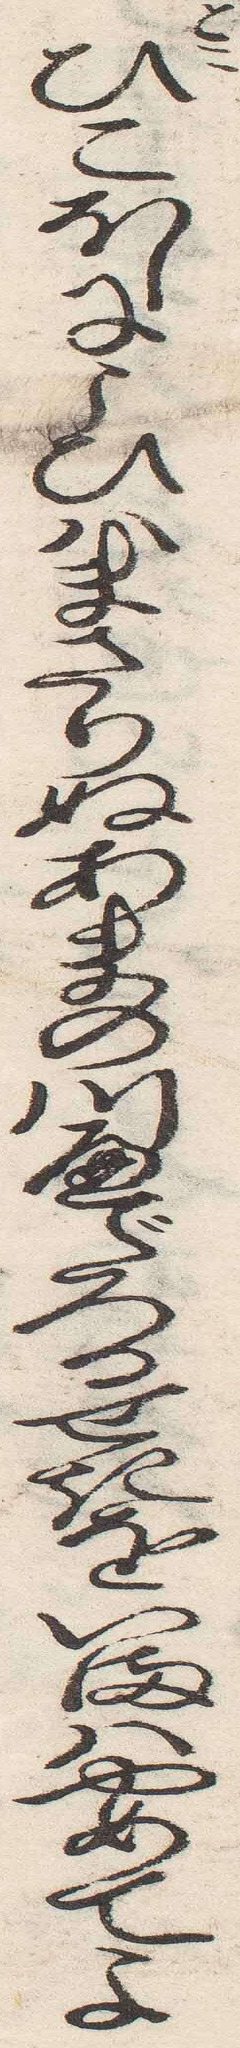ひこほしにこひはまさりぬあまの川へだつるせきをいまはやめてよ
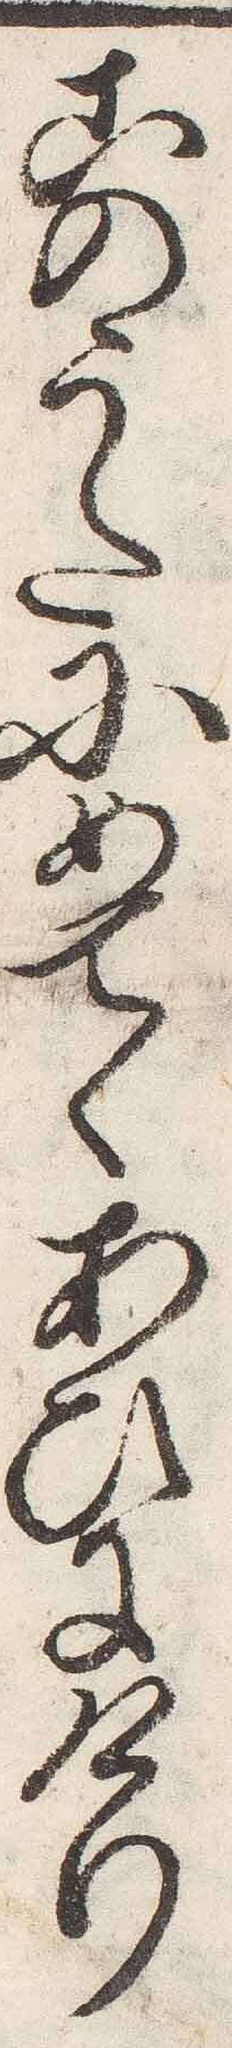このうたにめてゝあひにけり
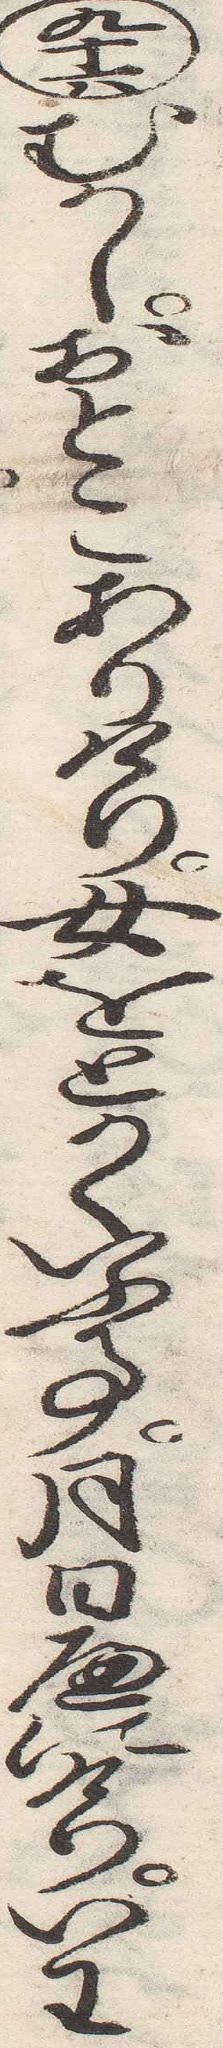九十六むかし。おとこありけり。女をとかくいふ事。月日へにけり。いわ
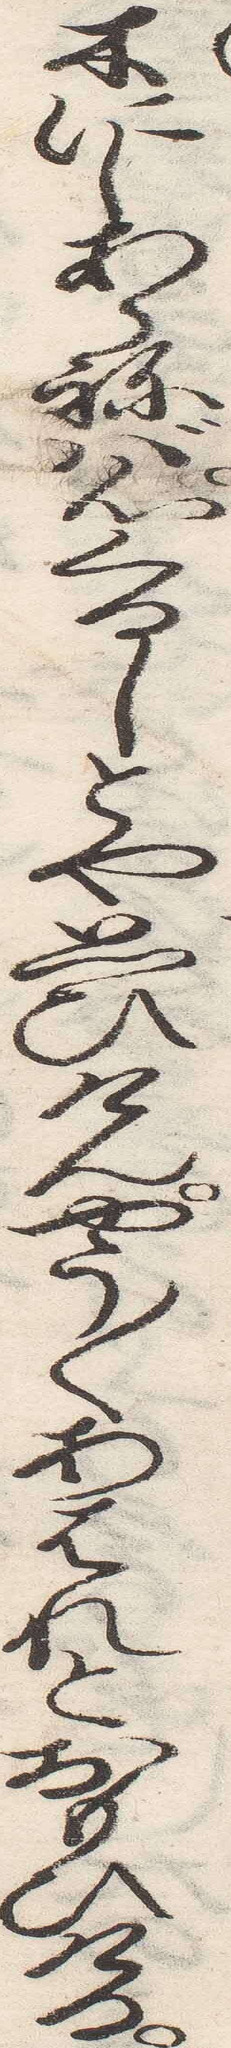木にしあらねば。心くるしとや思ひけん。やう〳〵あはれとおもひける。
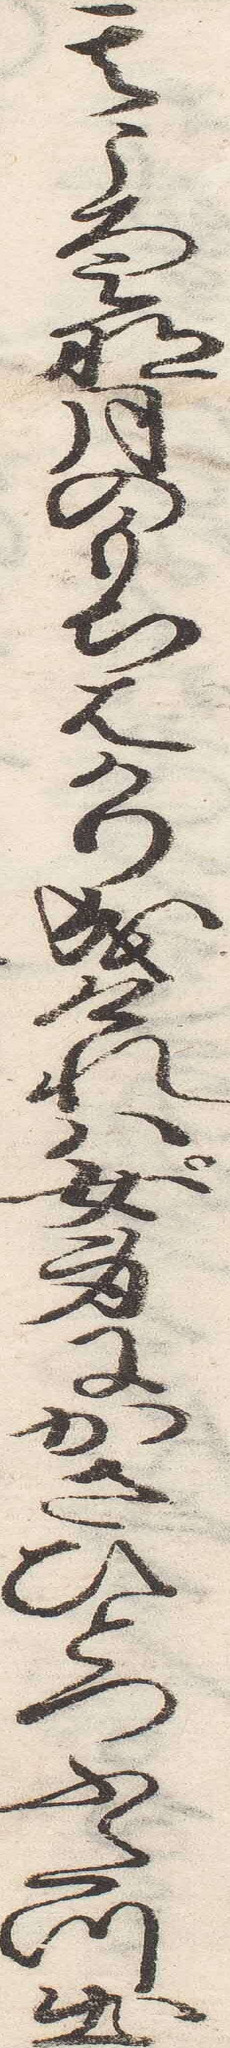其ころみな月のもちはかり成けれは。女身にかさひとつふたつ出
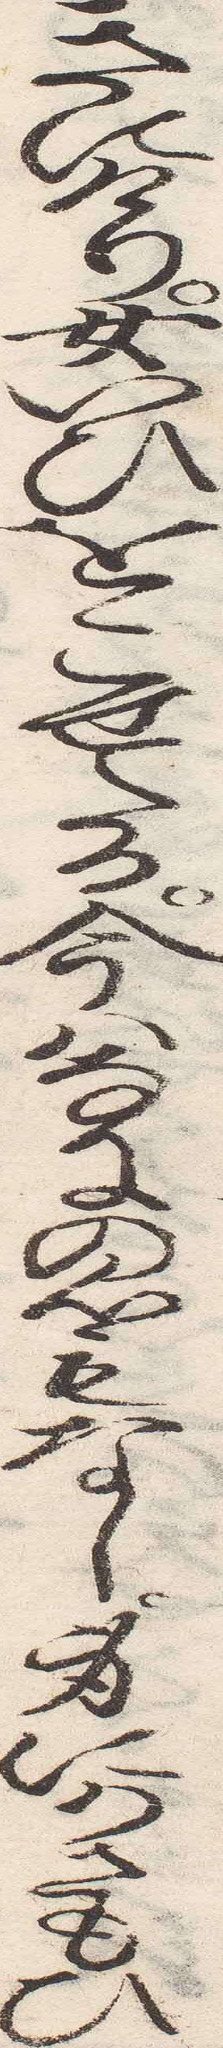きにけり。女いひをこせたる。今はなにの心もなし。身にかさもひ
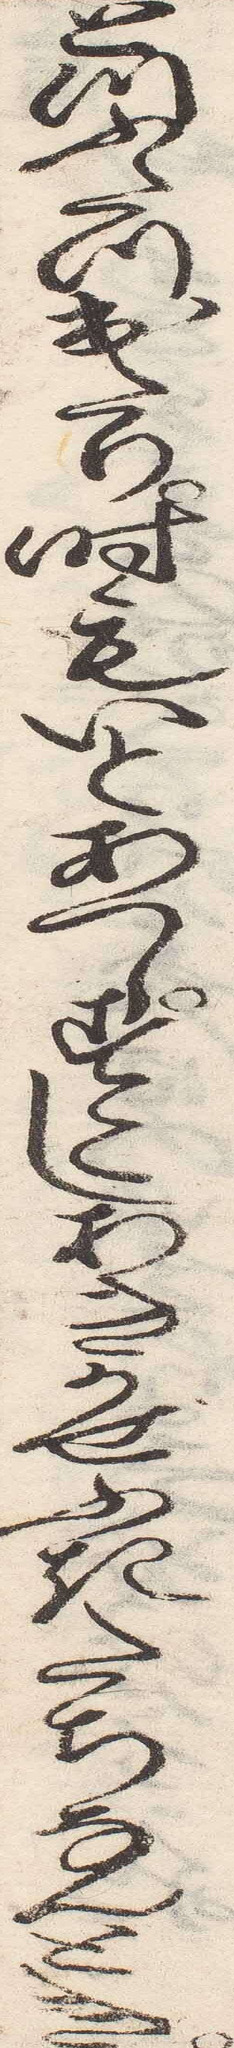とつふたつ出たり。時もいとあつし。すこしあきかせふきたちなんとき。
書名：伊勢物語
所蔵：東京学芸大学附属図書館 国文学研究資料館
